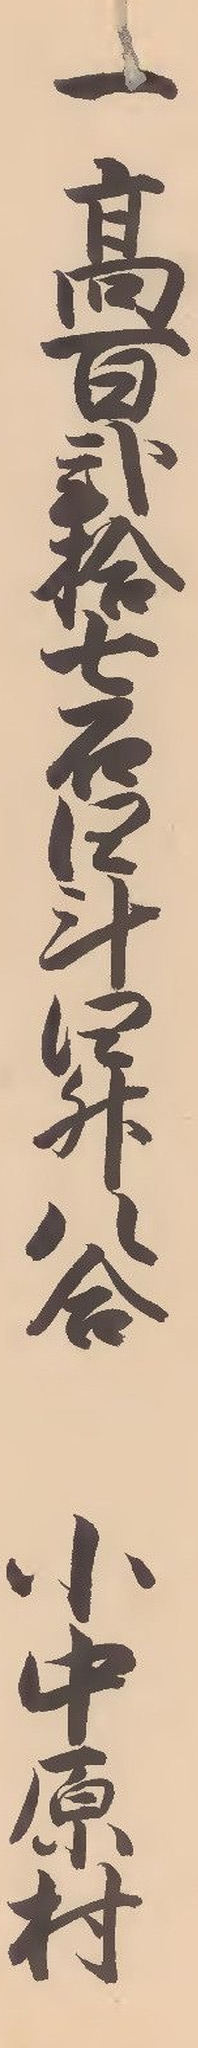一高百弐拾七石四斗四升八合小中原村
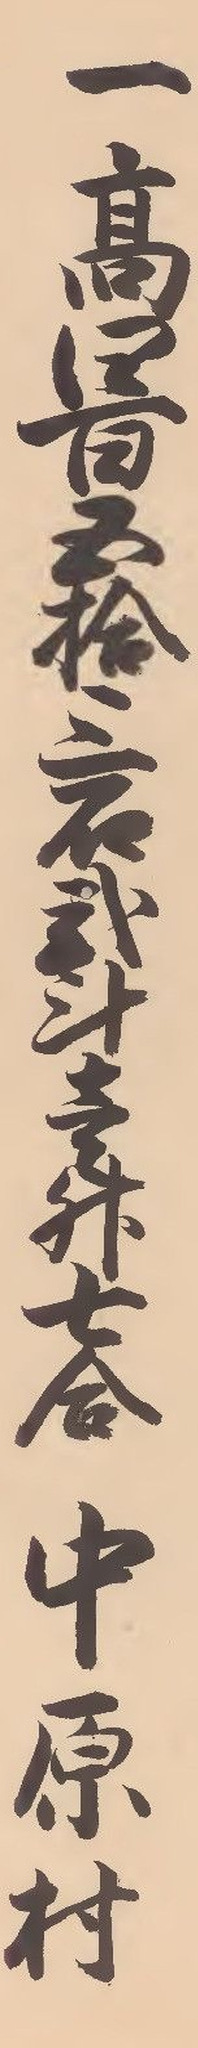一高四百五拾三石弐斗壱升七合中原村
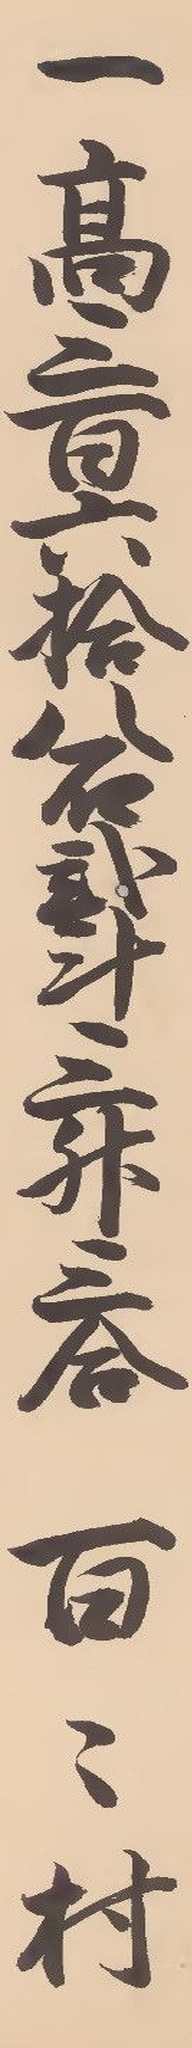一高三百六拾八石弐斗三升三合百々村
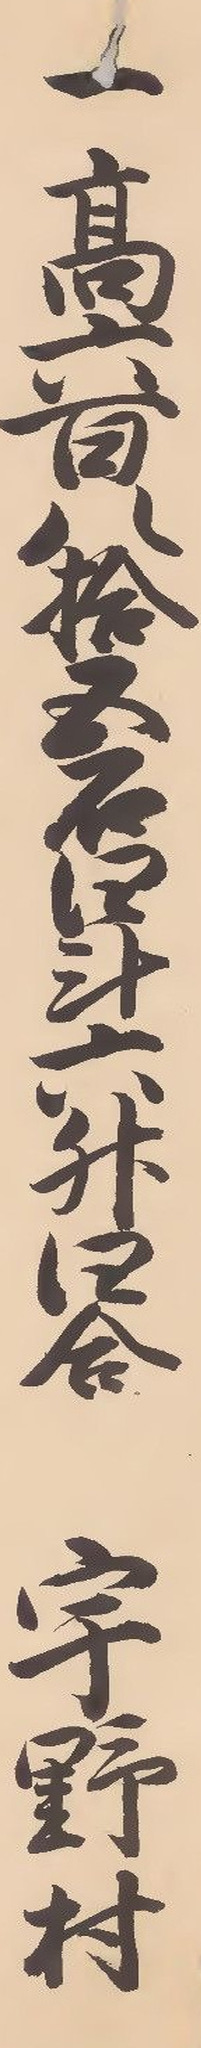一高六百八拾五石四斗六升四合宇野村
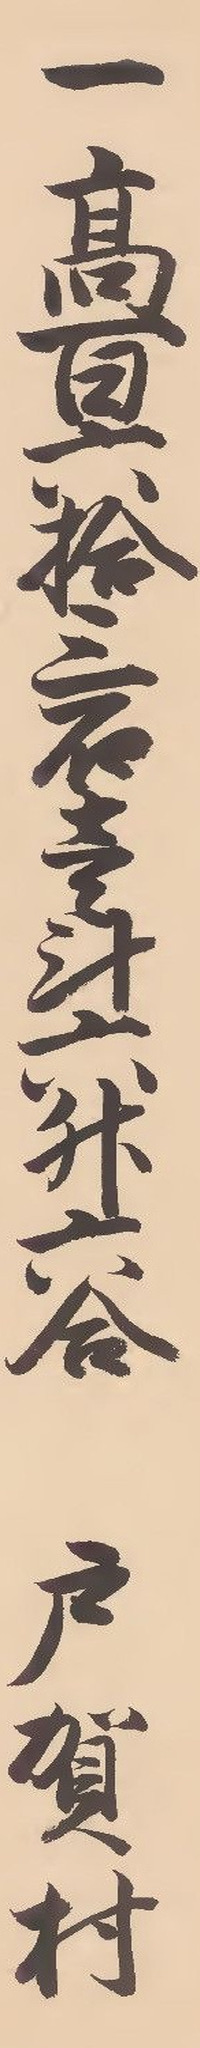一高百六拾三石壱斗六升六合戸賀村
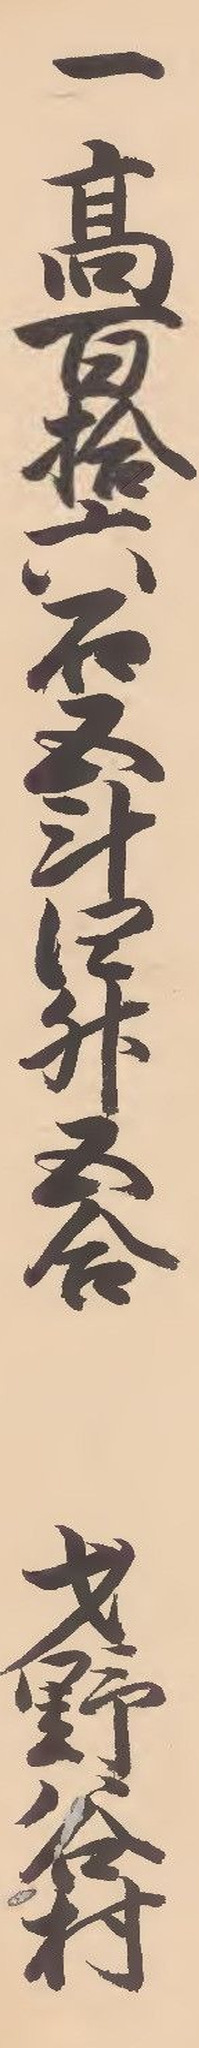一高百拾六石五斗四升五合才野谷村

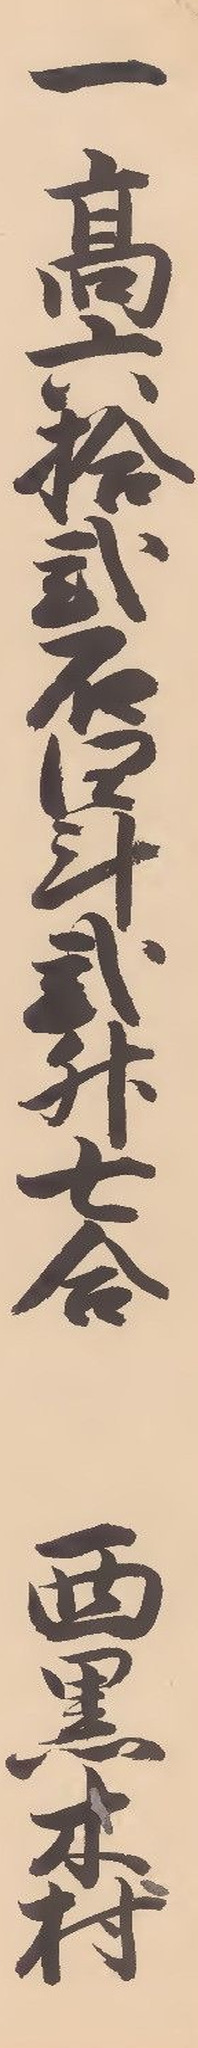一高六拾弐石四斗弐升七合西黒木村
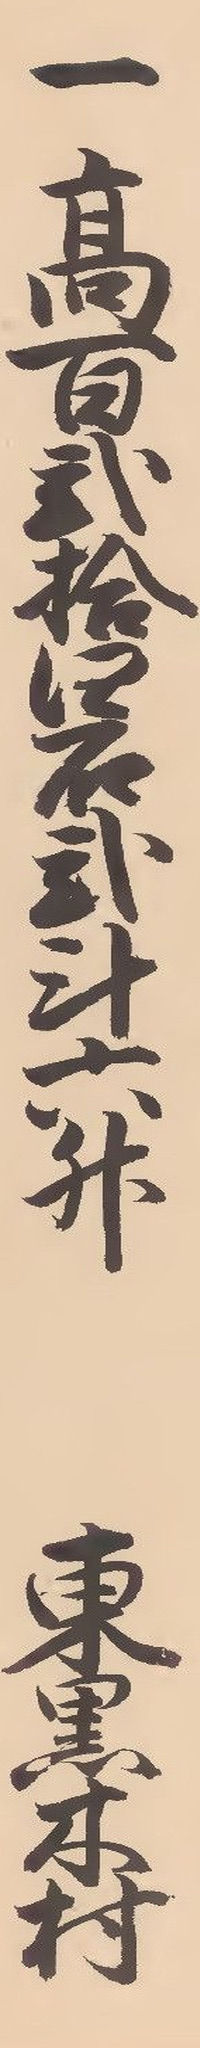一高百弐拾四石弐斗六升東黒木村
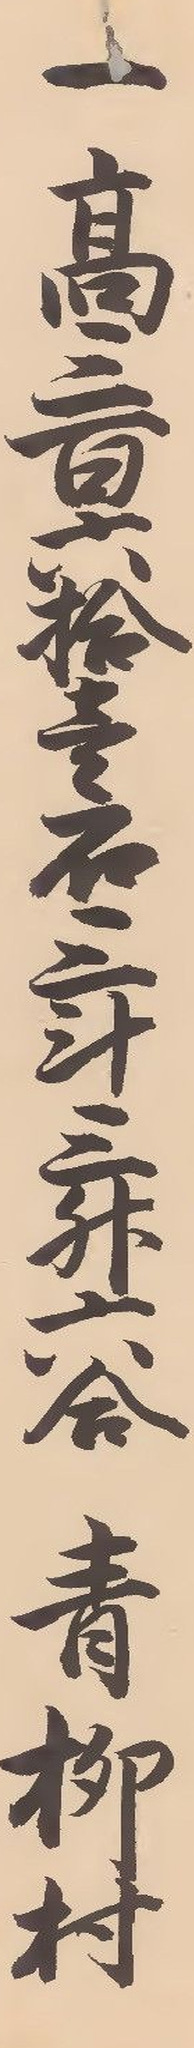一高三百六拾壱石三斗三升六合青柳村
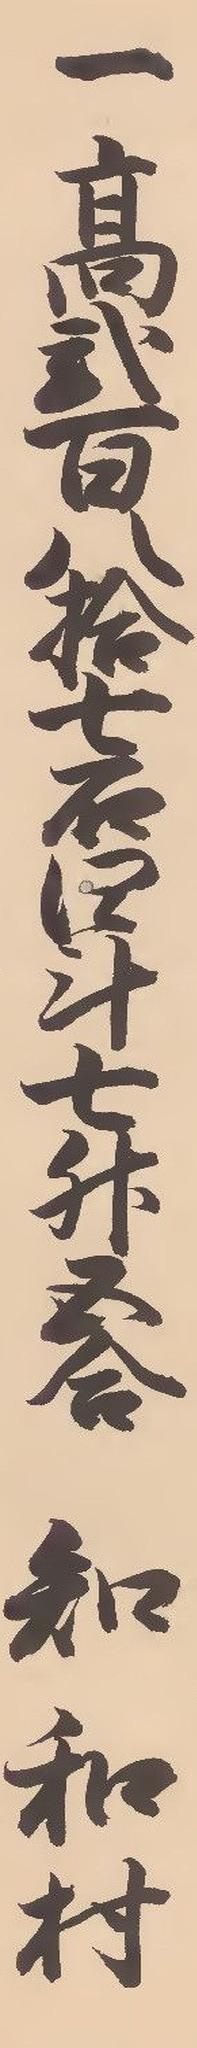一高弐百八拾七石四斗七升五合知和村
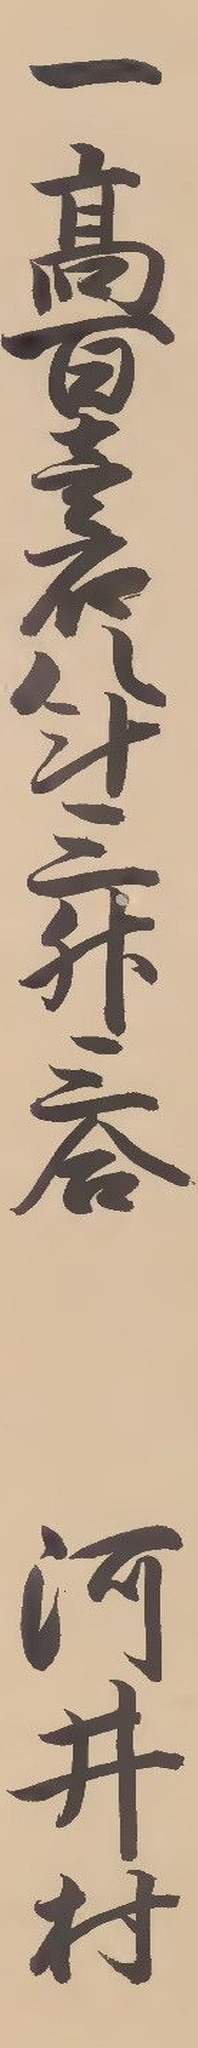一高百壱石八斗三升三合河井村
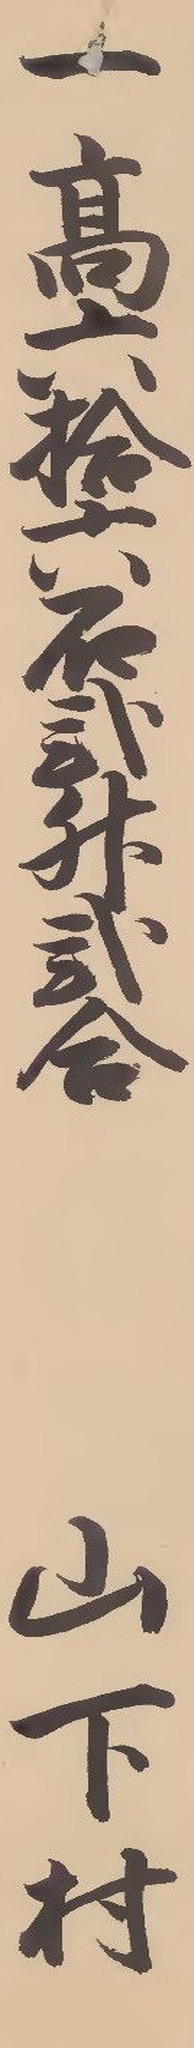一高六拾六石弐升弐合山下村
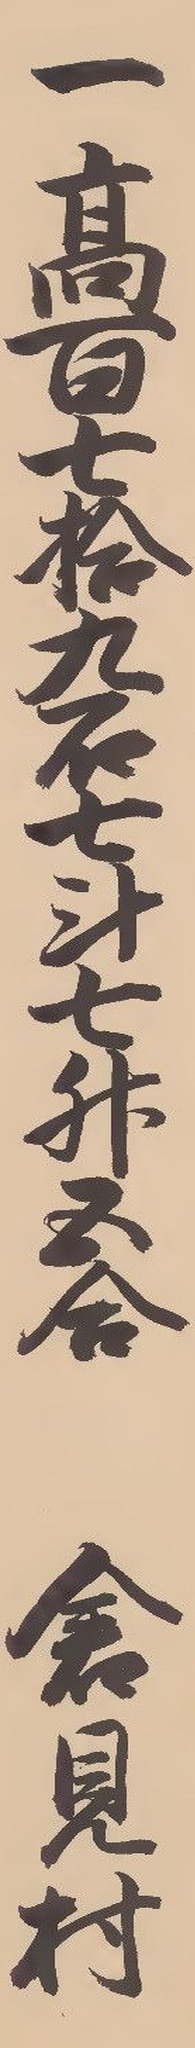一高百七拾九石七斗七升五合倉見村
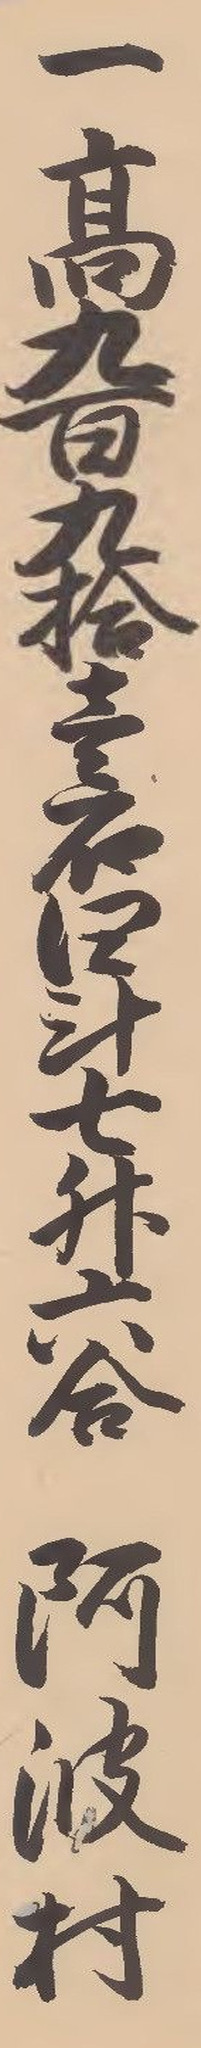一高九百九拾壱石四斗七升六合阿波村

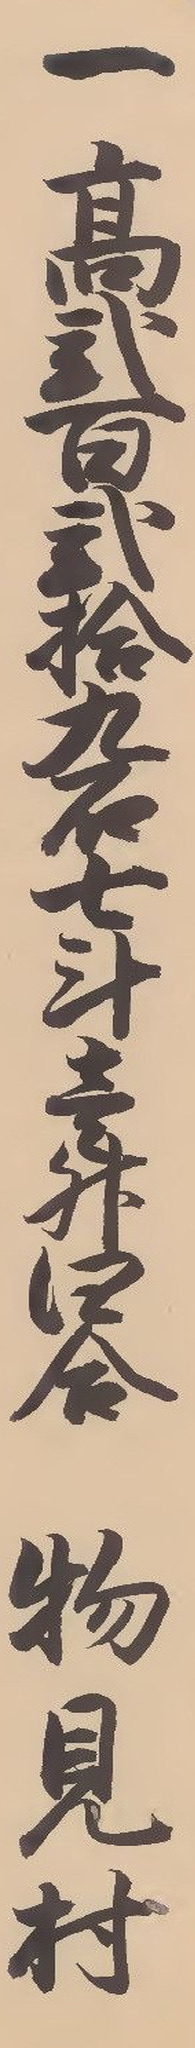一高弐百弐拾九石七斗壱升四合物見村
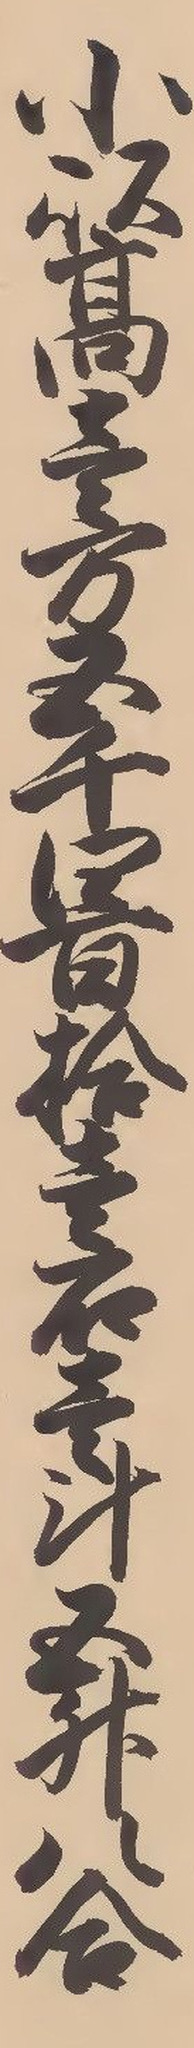小以高壱万五千四百拾壱石壱斗五升八合
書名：美作国郷帳
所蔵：国立公文書館 National Archives of Japan
